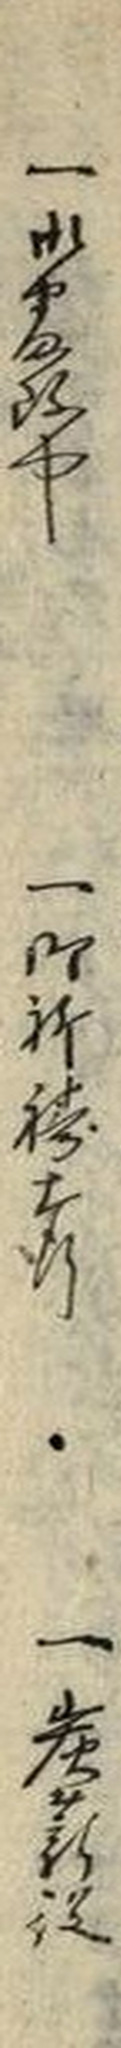一御番改中一御祈祷奉行一炭薪役
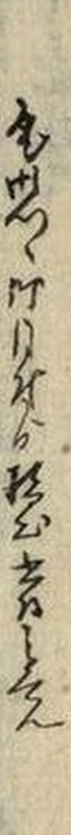瓦御門へ御目付ゟ指出書付之覚
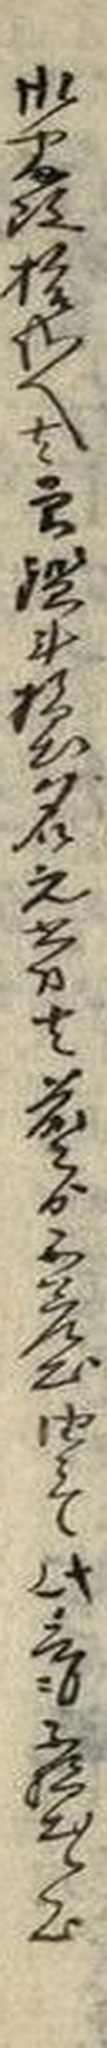御番改拾弐人は印鑑斗指出名元書付は前々ゟ不差出由にて此度も不指出候以上
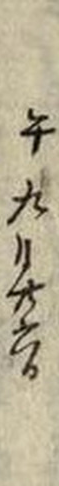午九月廿六日
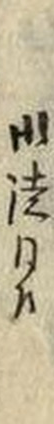御徒目付
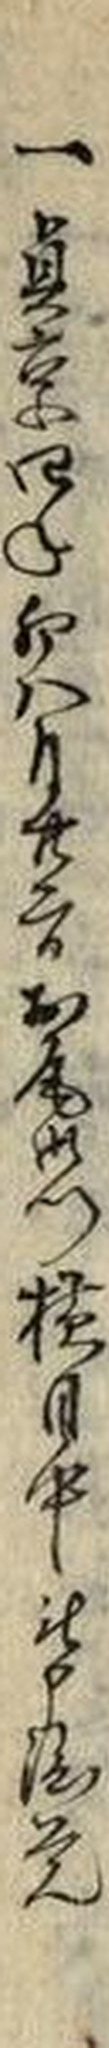一貞享四年卯八月廿二日於瓦御門横目中被申渡候覚
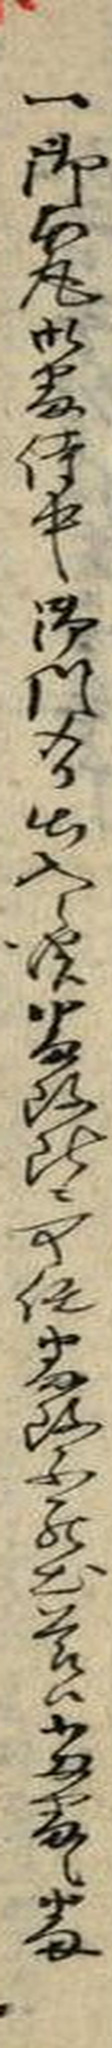一御本丸御番侍中御門〆り出入候儀ハ番改断に可任番改不罷出節は当番之番

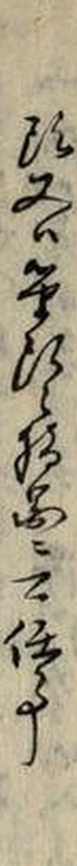頭又は筆頭之指図に可任事
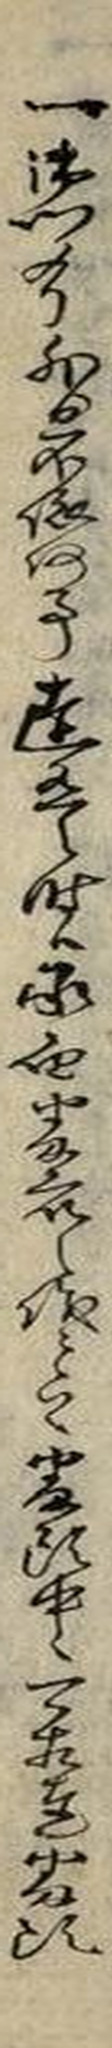一御門〆り外ゟ不依何事達有之時は承届番衆之儀に候はゝ番頭中へ可相達番頭
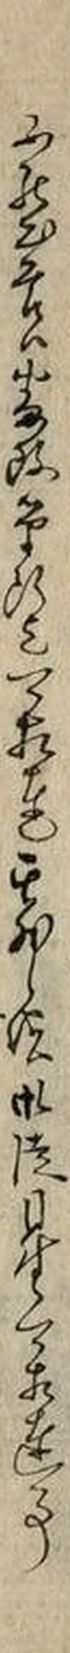不罷出節は番改筆頭迄可相達其外之儀は御徒目付へ可相達候事
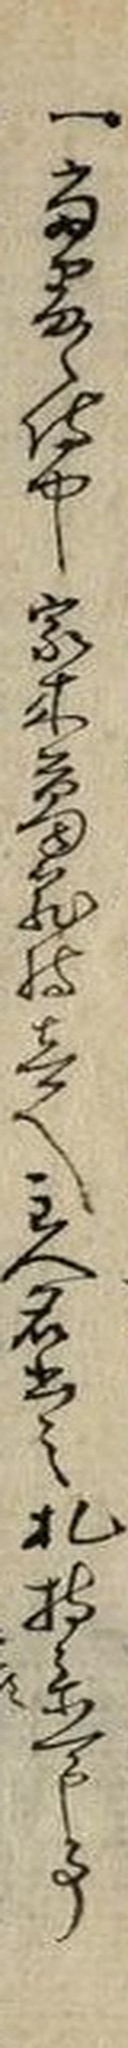一当番之侍中家来葛籠持壱人主人名書之札持参可申事
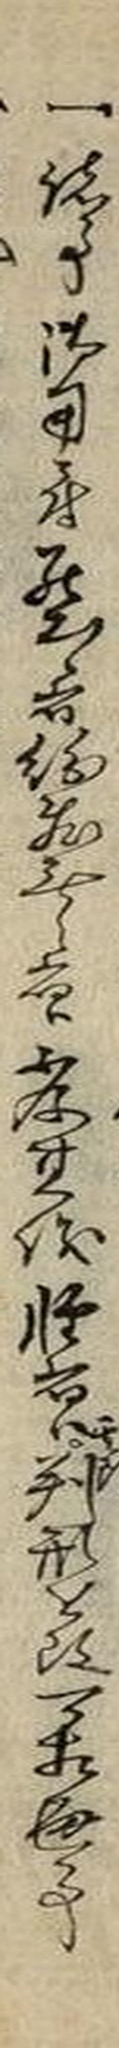一諸事御用に付罷出候者紛敷無之者は不及其儀軽者は其頭判形を改可相通事
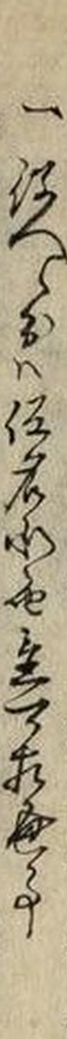一役人之分は仮名承届置可相通事
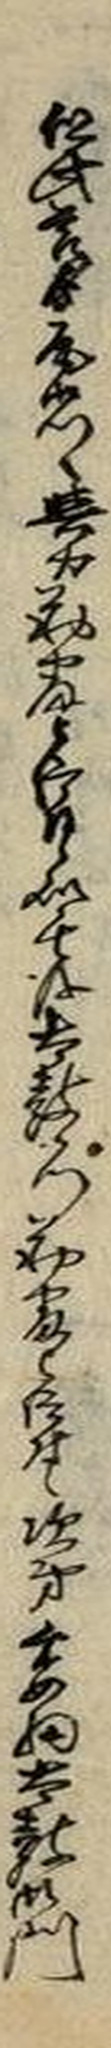但此節より瓦御門之与力勤番被仰付候処其後太鼓御門勤番被仰付候次第委細太鼓御門
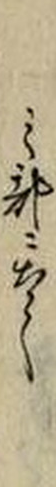之部に出之
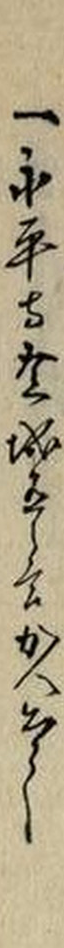一永平寺登城有之節加人出之
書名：御門御櫓之部
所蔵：福井県文書館 Fukui Prefectural Archives
